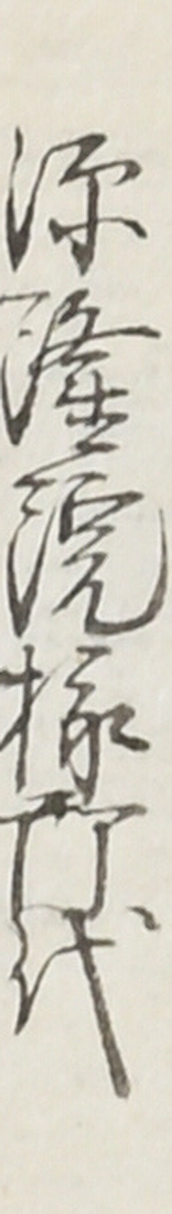源隆院様御代
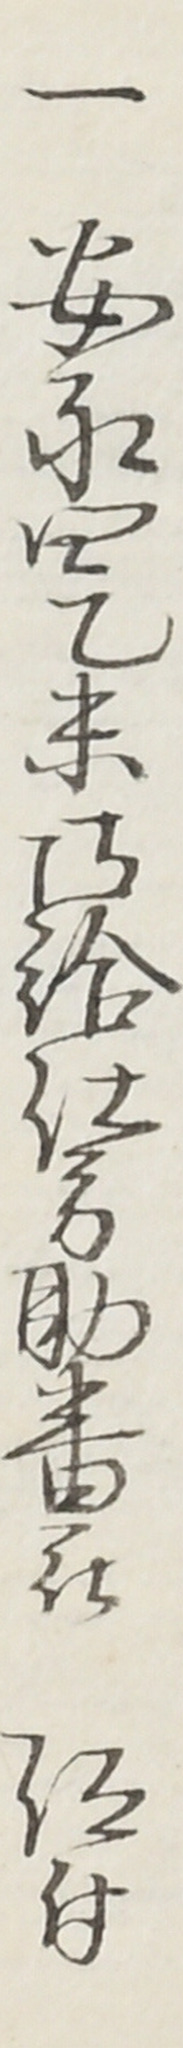一安永四乙未御給仕方助番被仰付
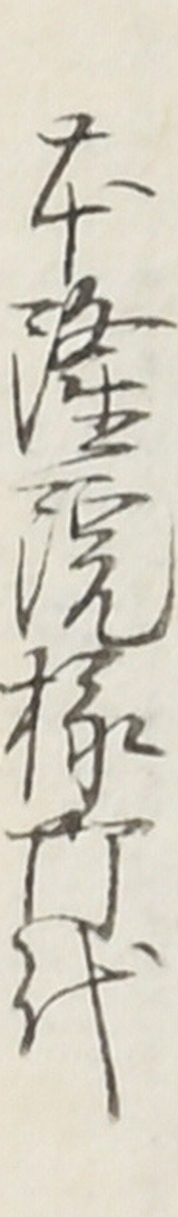本隆院様御代

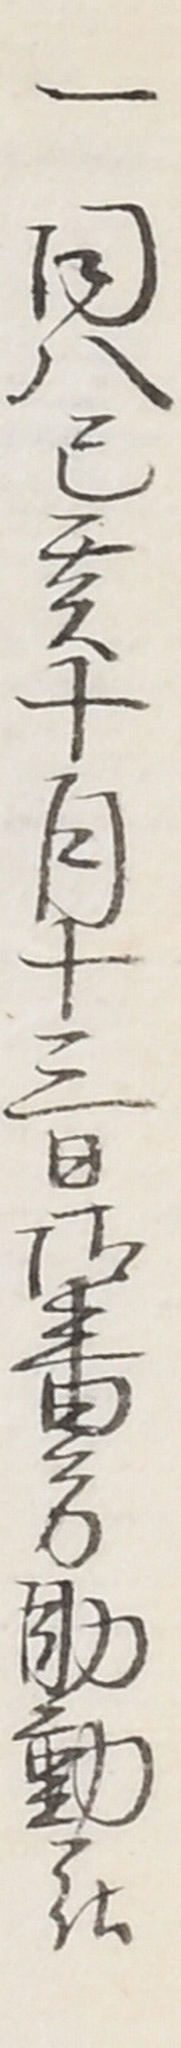一同八己亥十月十三日御番方助勤被
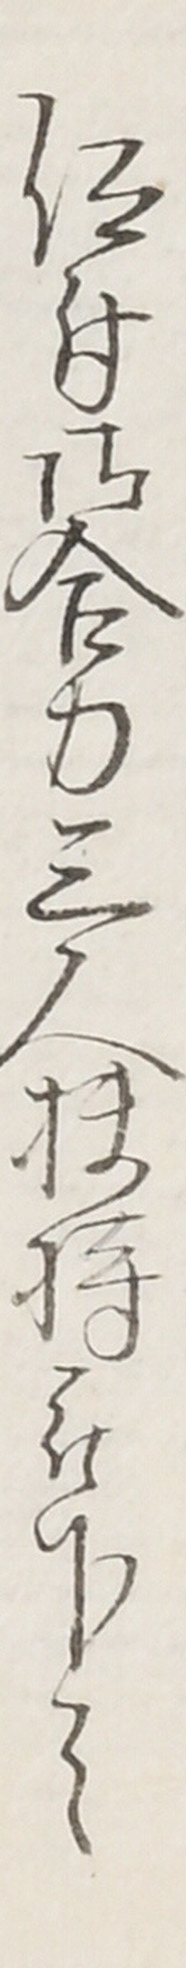仰付御合力三人扶持被下之
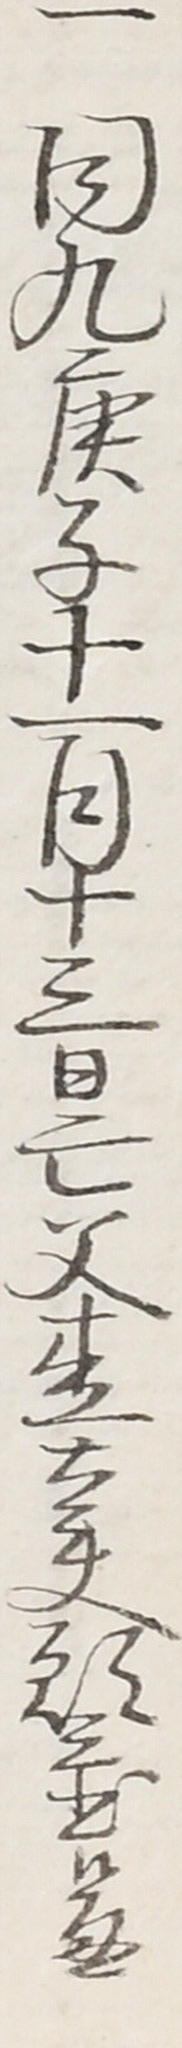一同九庚子十一月十三日亡父杢太夫願置候通
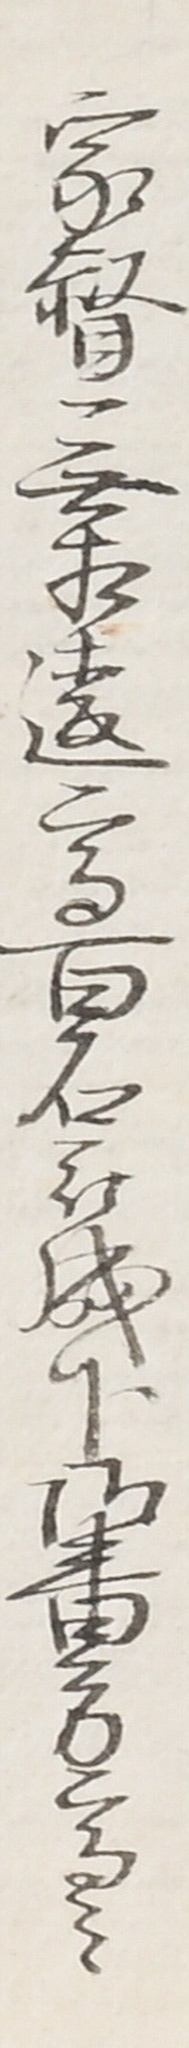家督無相違高百石被成下御番方高之
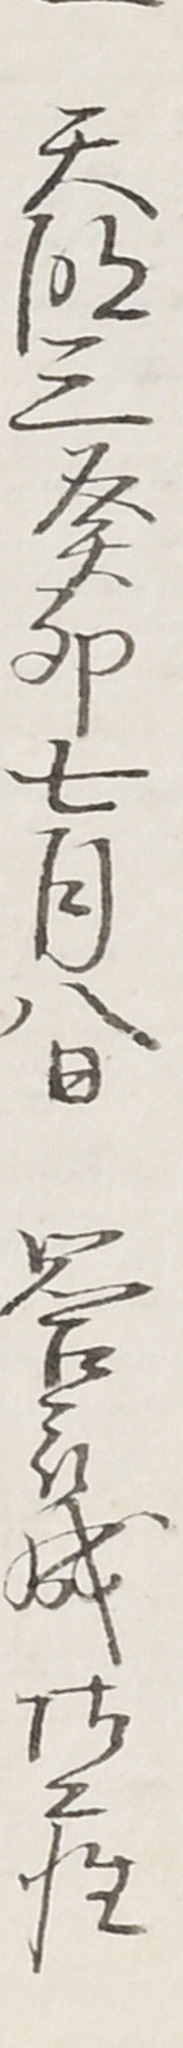一天明三癸卯七月八日思召被成御座
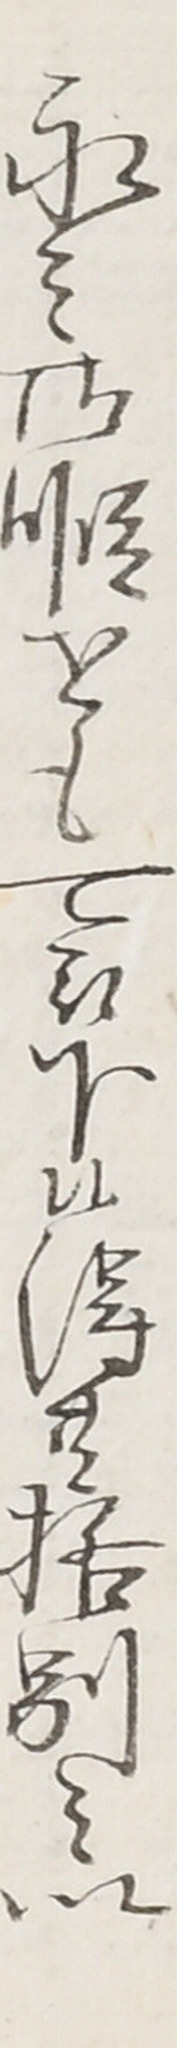永之御暇をも可被下候得共格別之以
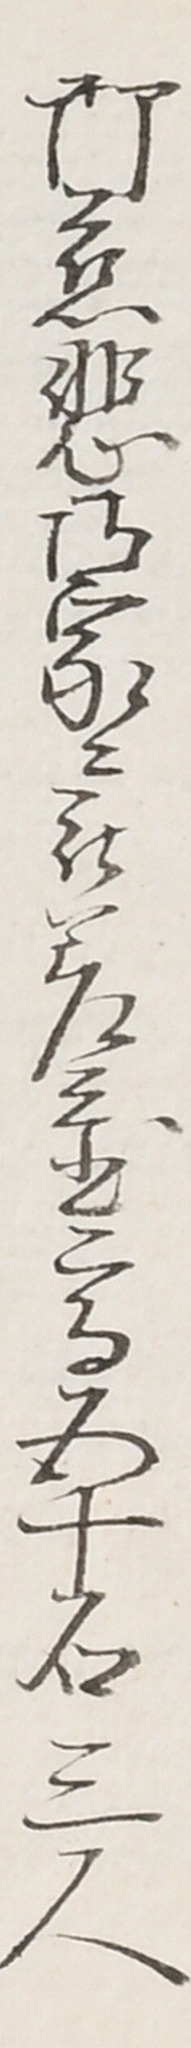御慈悲御家ニ被差置高五十石三人
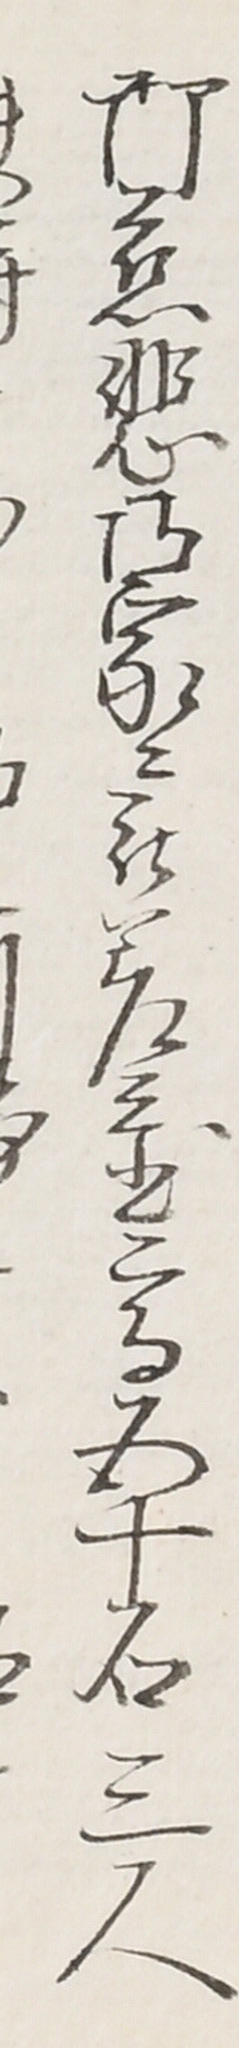御慈悲御家ニ被差置高五十石三人
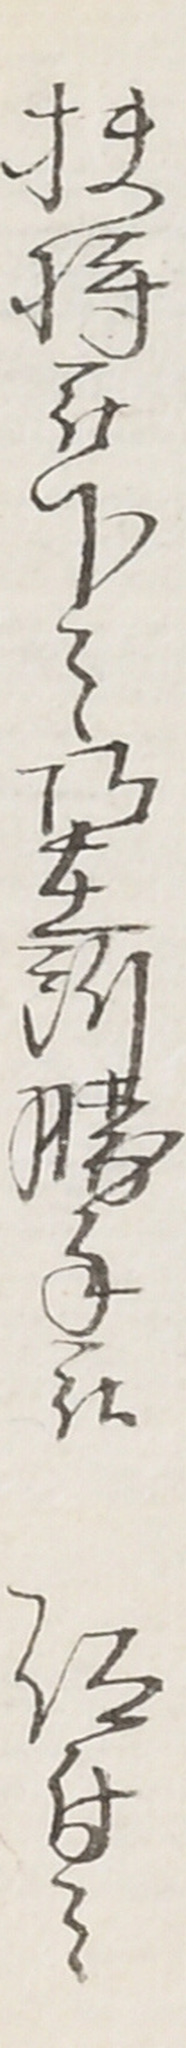扶持被下之御在所勝手被仰付之
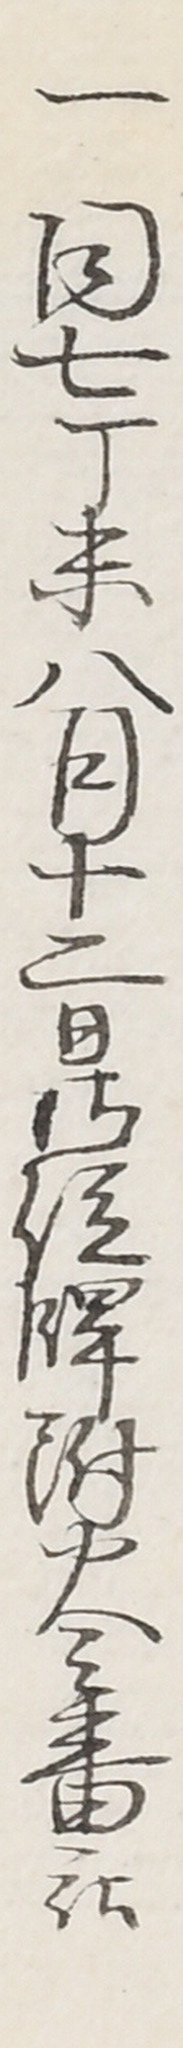一同七丁未八月十二日位牌附火之番被
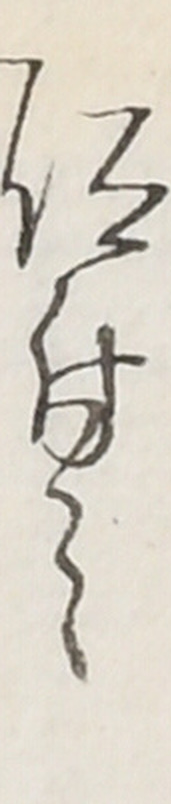仰付之
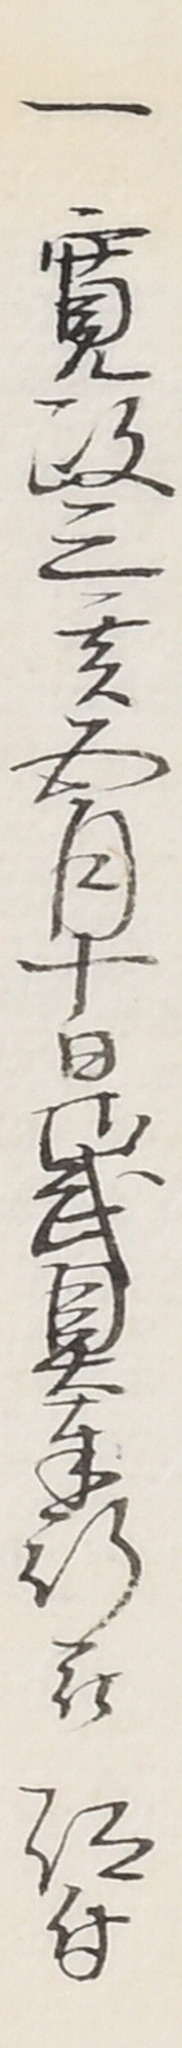一寛政三亥五月十月御武具奉行被仰付
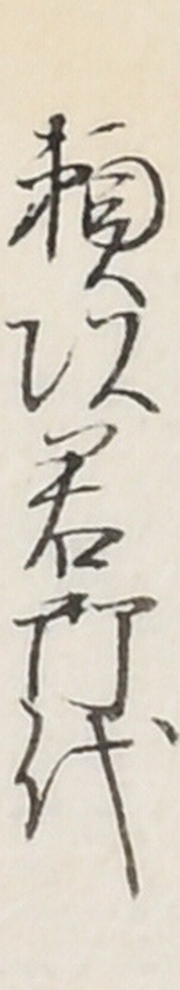頼以君御代
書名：給人諸士勤仕録（七）
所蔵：伊那市立高遠町図書館・合同会社AMANE
